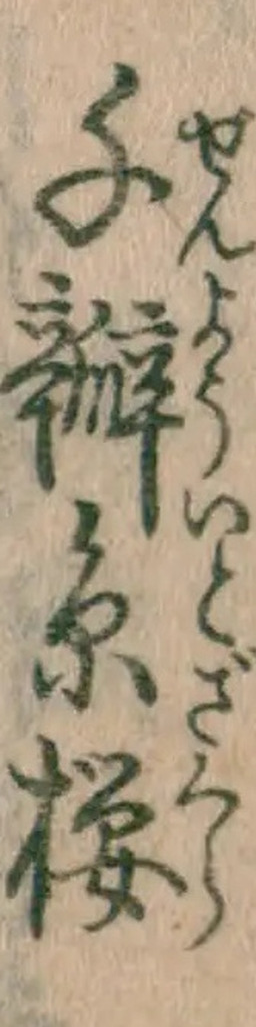千弁糸桜

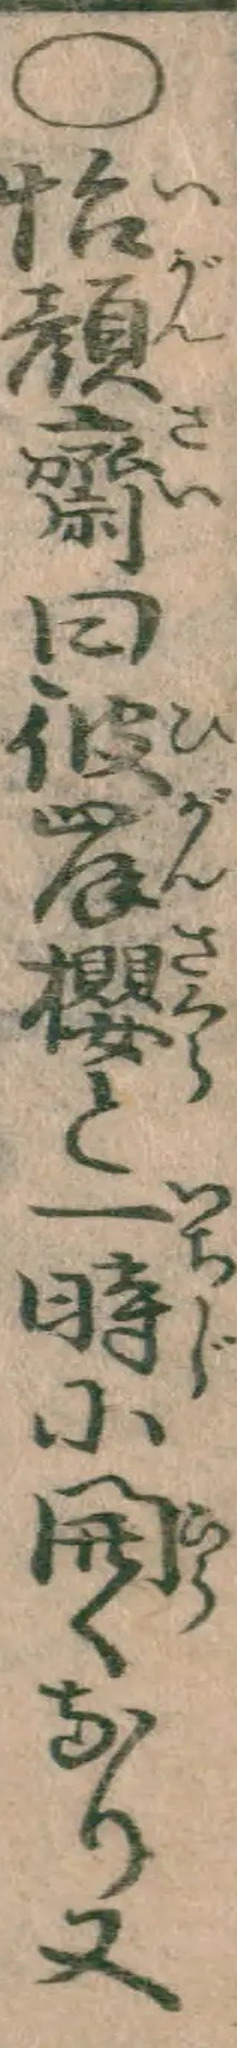○怡顔斎曰彼岸桜と一時に開くなり又
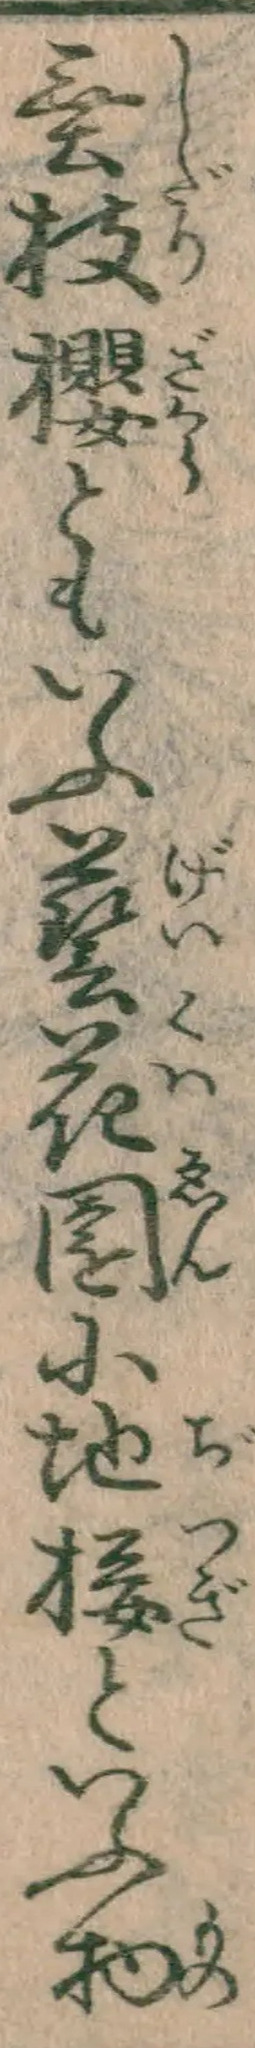垂枝桜ともいふ芸花園に地接といふ物
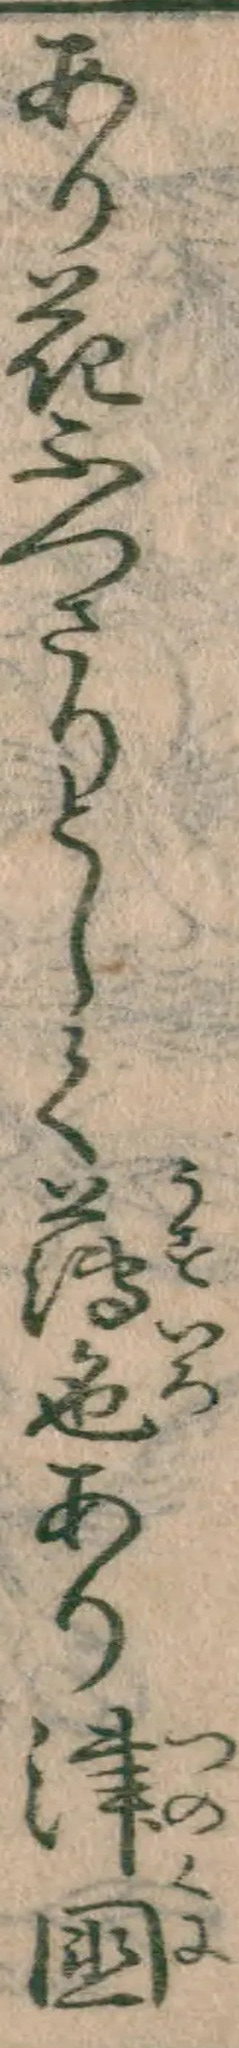あり花ふつさりとして薄色あり津国
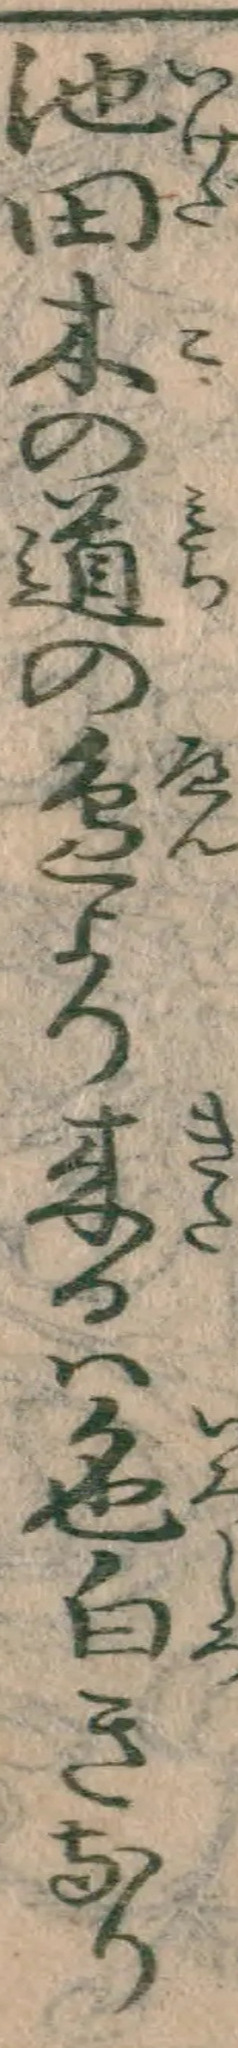池田木の道の辺より来るは色白きなり
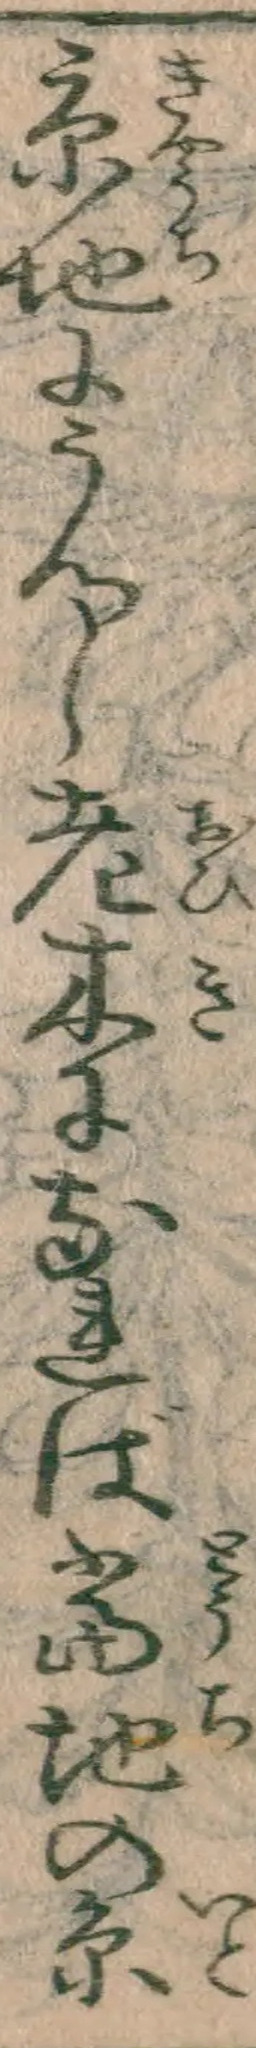京地にうつし老木になれば当地の糸
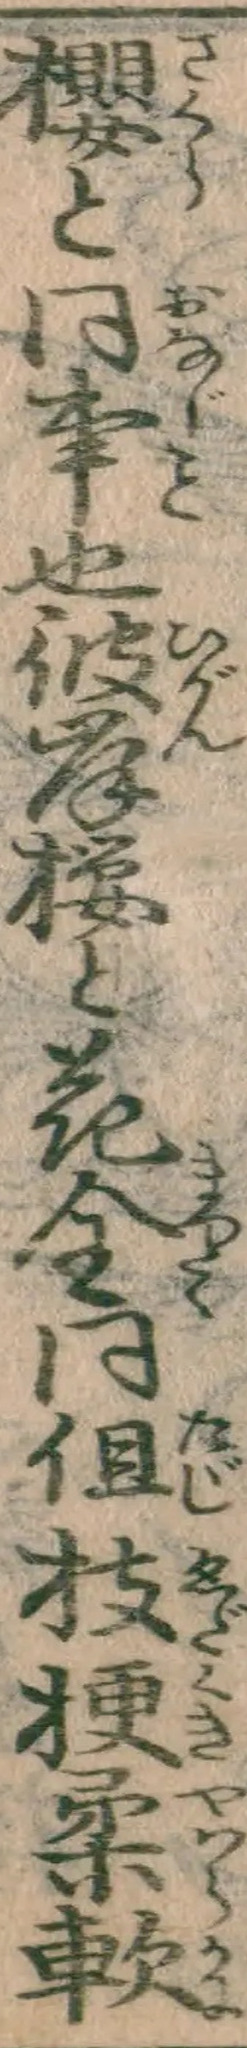桜と同事也彼岸桜と花全同但枝梗柔軟
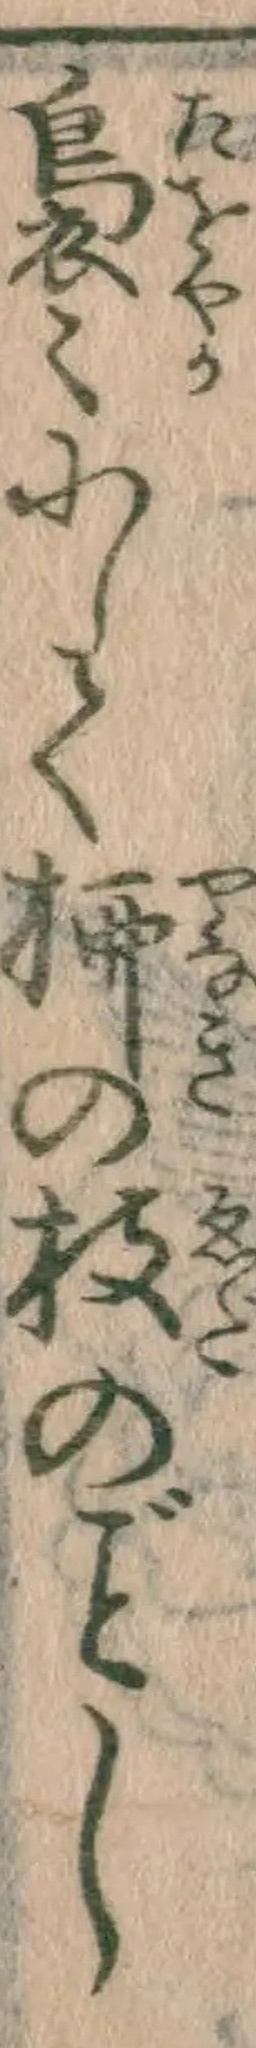裊々にして柳の枝のごとし
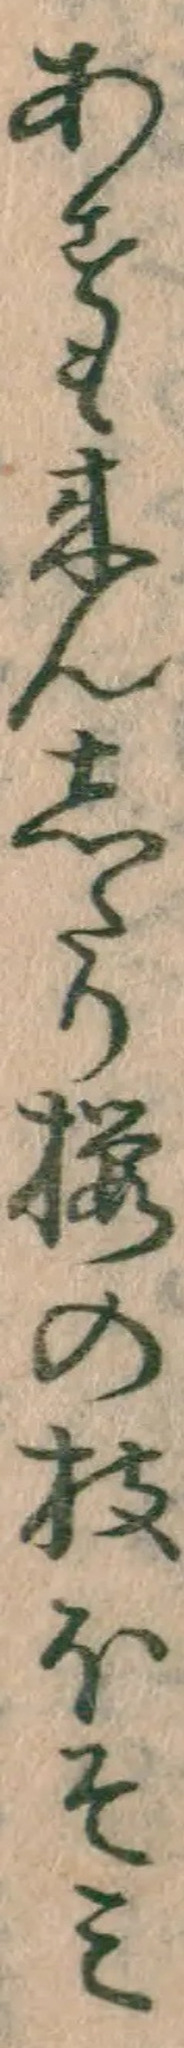あすも来んしたり桜の枝ほそみ
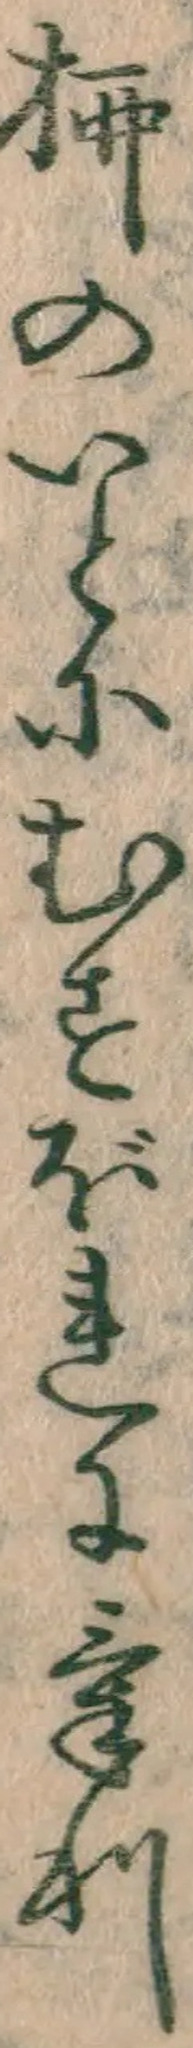柳のいとにむすぼれにけり
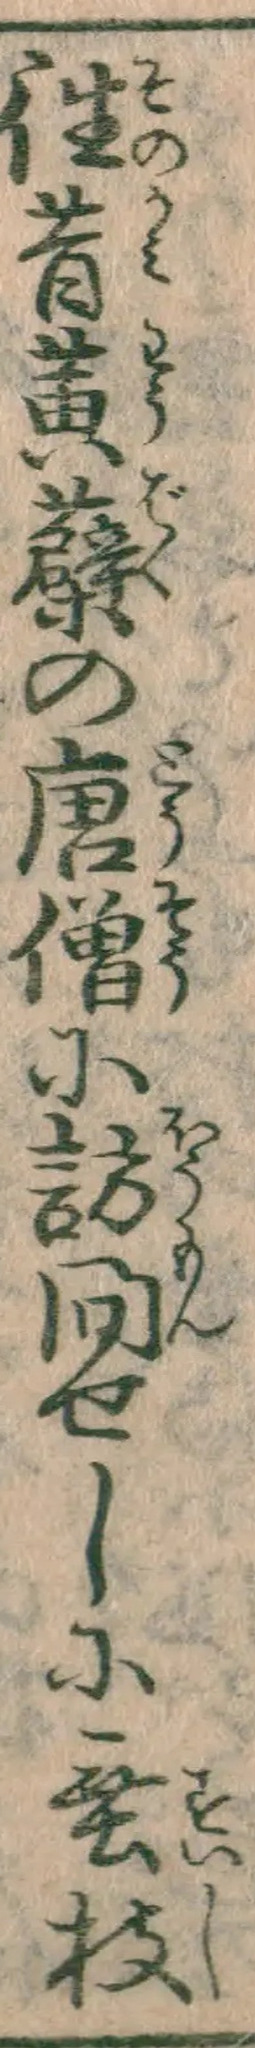往昔黄檗の唐僧に訪問せしに垂枝
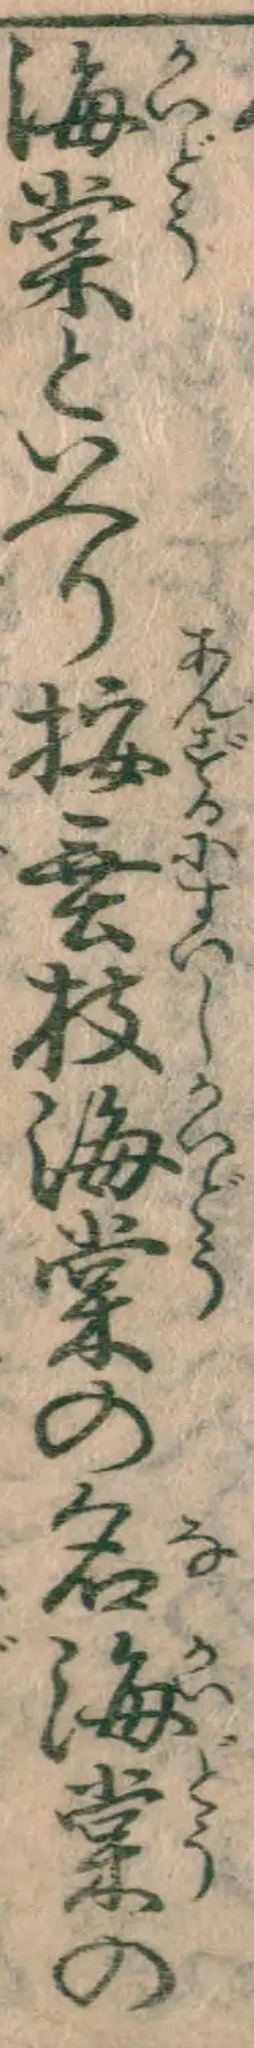海棠といへり按垂枝海棠の名海棠の
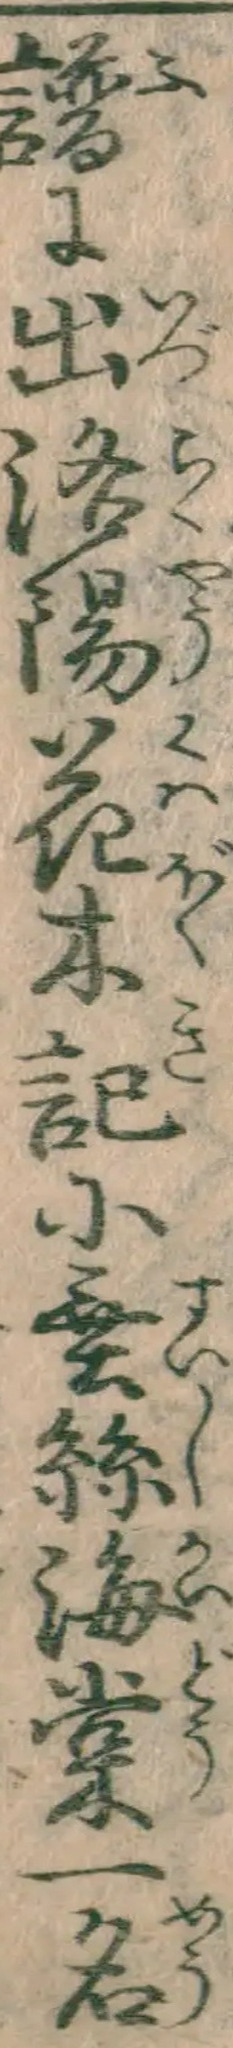譜に出洛陽花木記に垂絲海棠一名
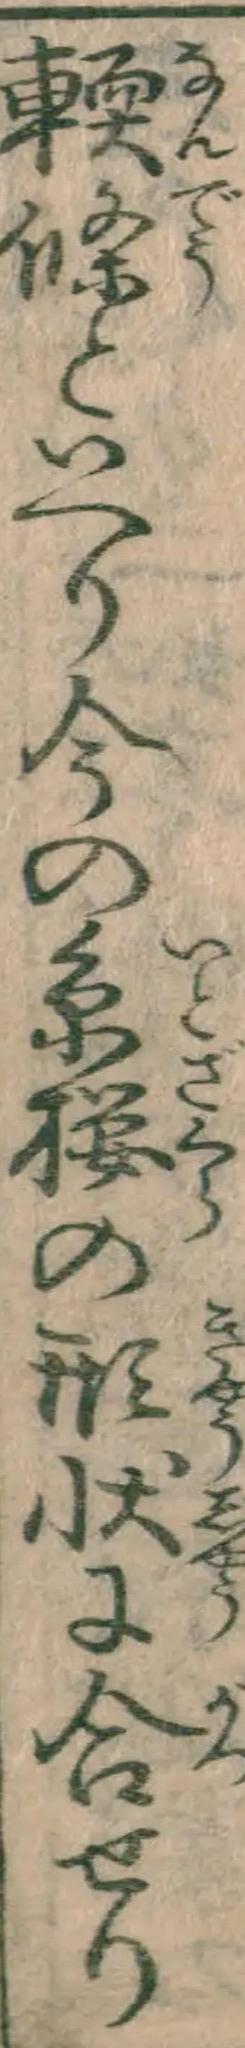輭條といへり今の糸桜の行状に合せり

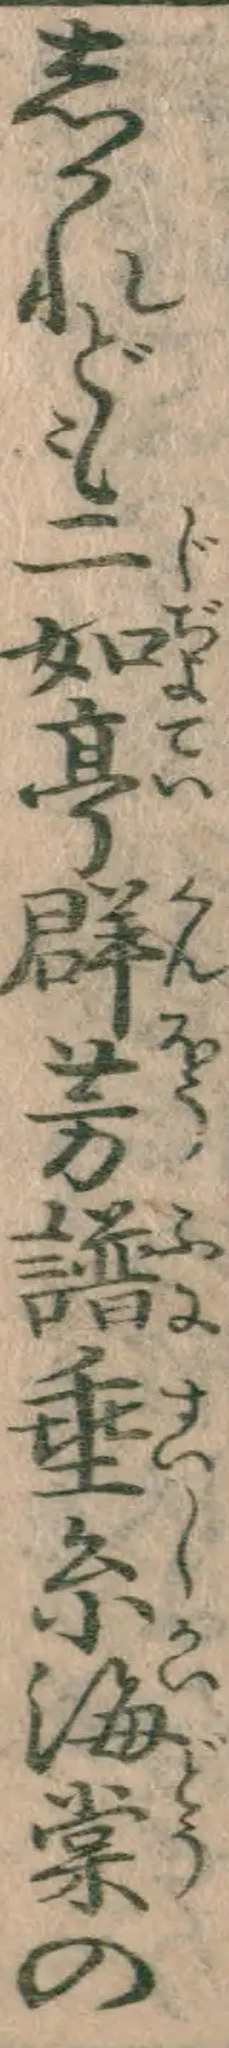しかれども二如亭群芳譜垂糸海棠の
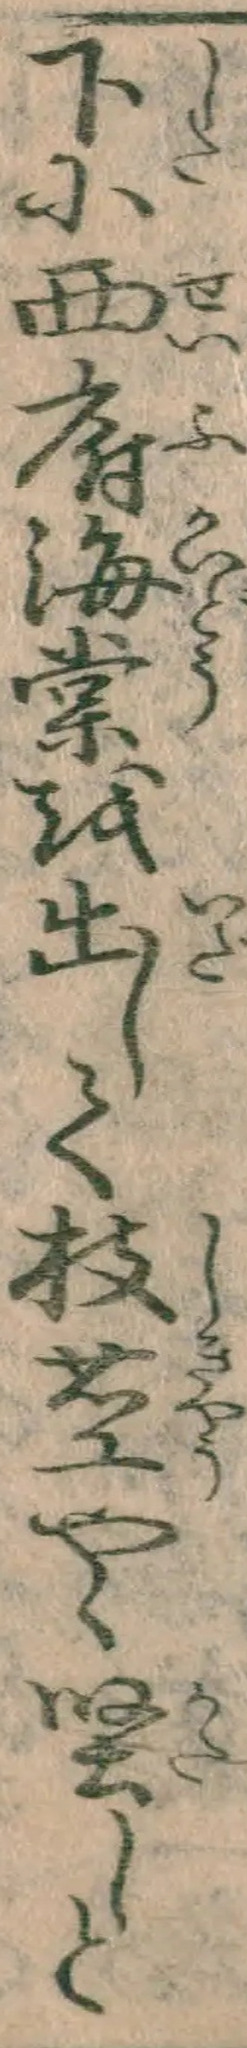下に西府海棠を出して枝茎やゝ堅しと
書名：怡顔齋櫻品
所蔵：国立国会図書館 National Diet Library, JAPAN
